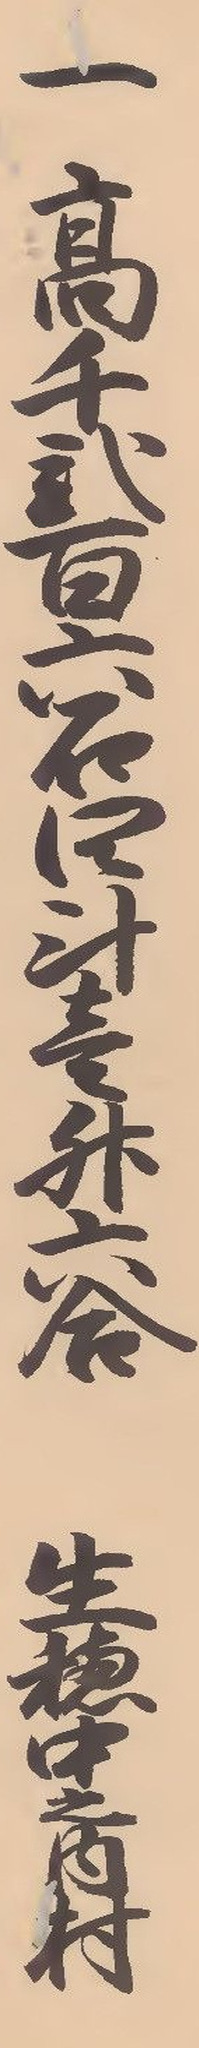一高千弐百六石四斗壱升六合生穂中之内村
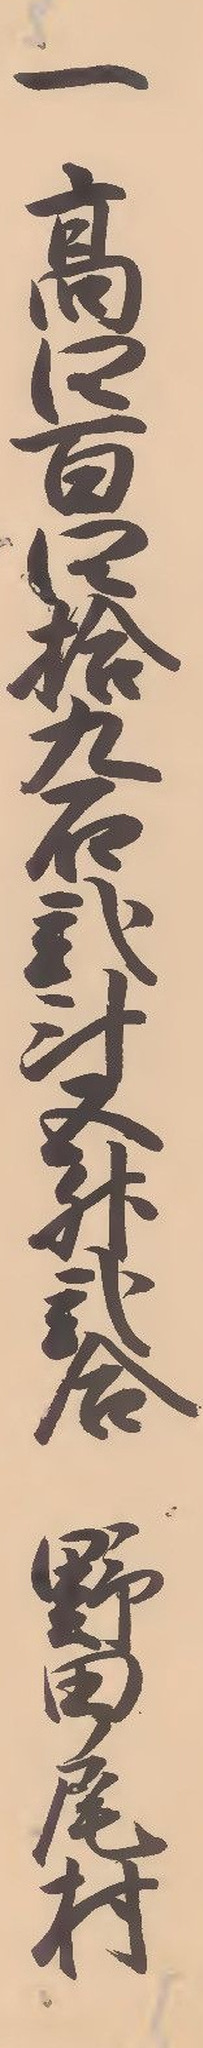一高四百四拾九石弐斗五升弐合野田ノ尾村

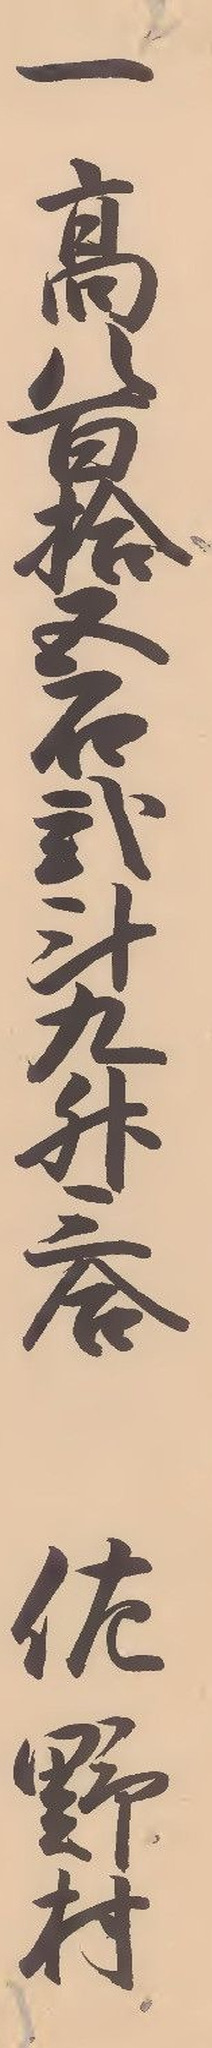一高八百拾五石弐斗九升三合佐野村
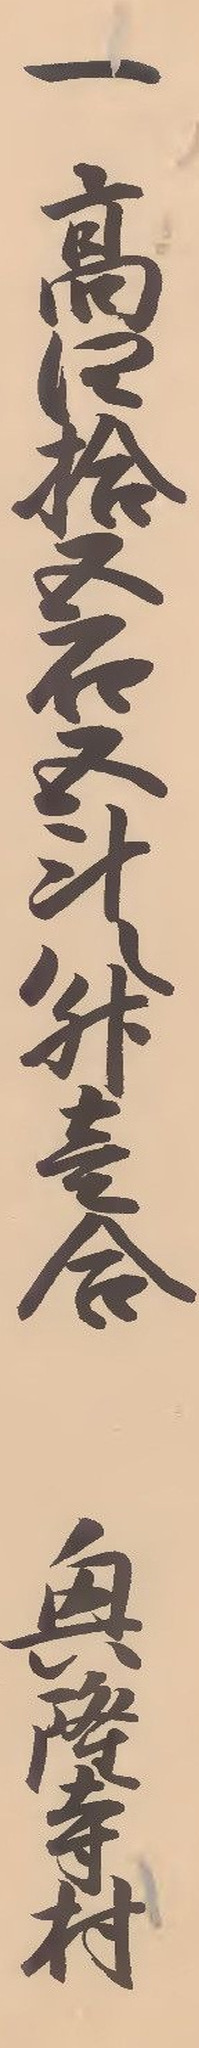一高四拾五石五斗八升壱合興隆寺村
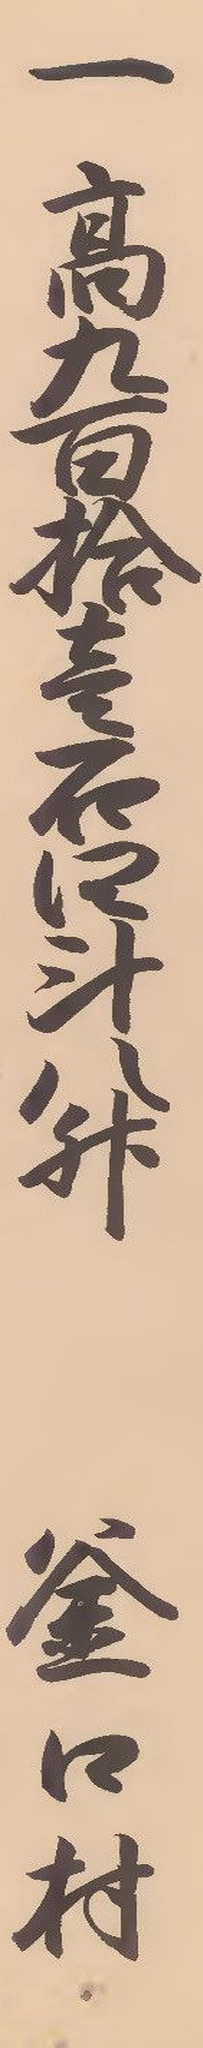一高九百拾壱石四斗八升釜口村
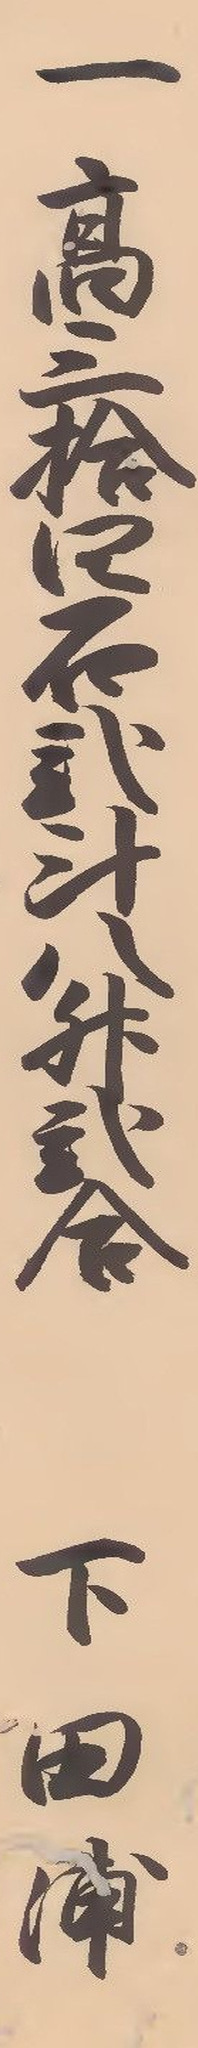一高三拾四石弐斗八升弐合下田浦
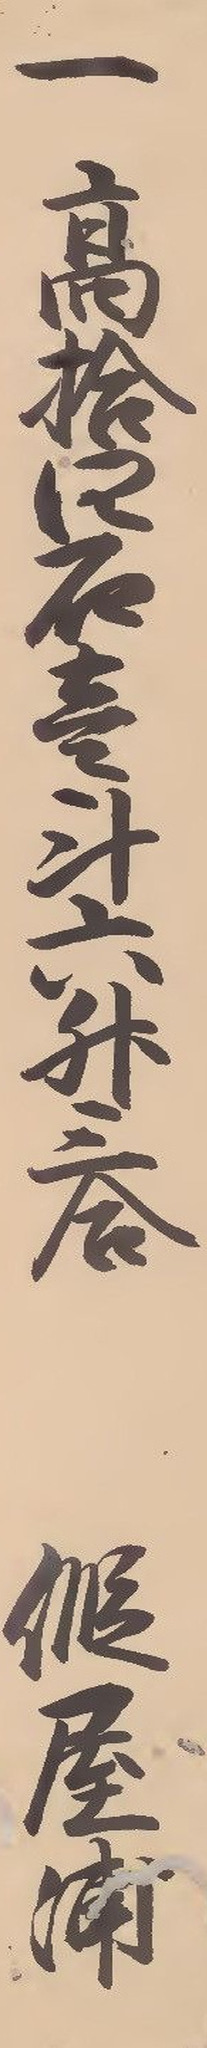一高拾四石壱斗六升三合仮屋浦
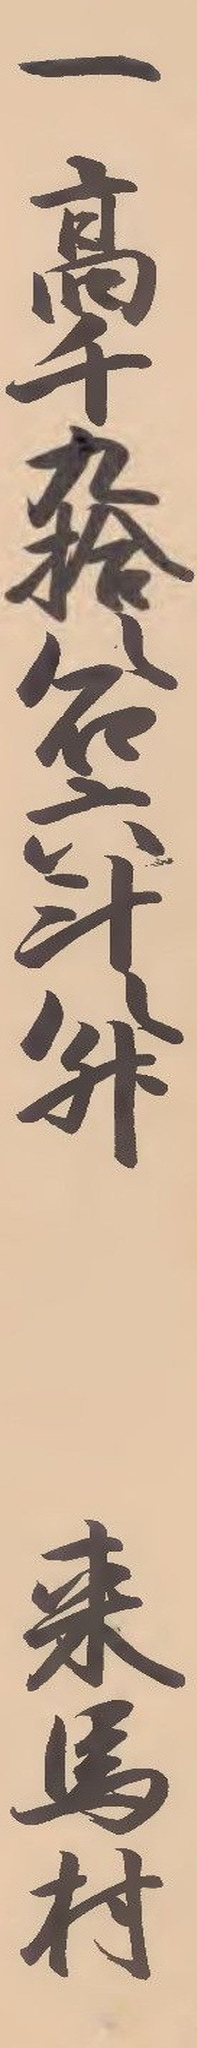一高千九拾八石六斗八升来馬村
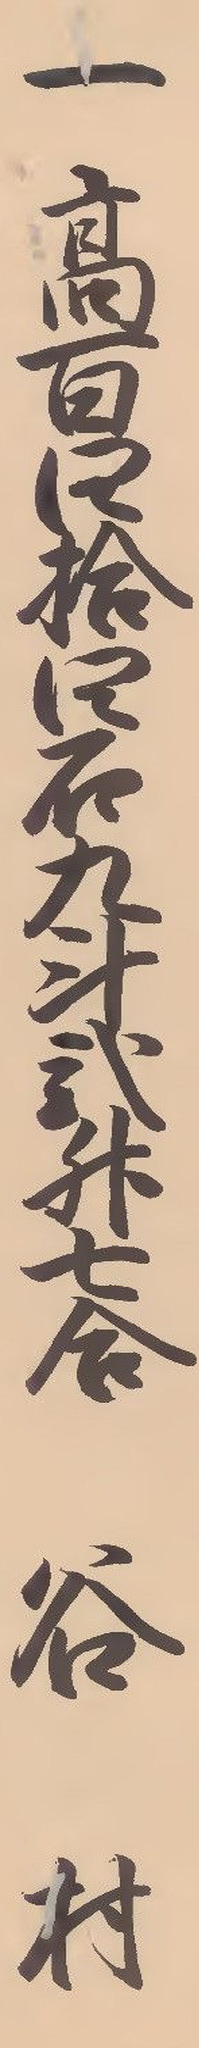一高百四拾四石九斗弐升七合谷村
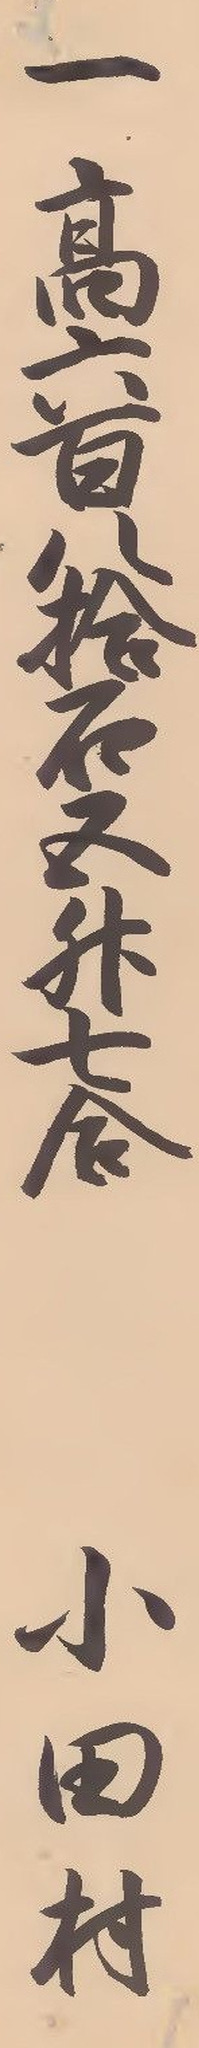一高六百八拾石五升七合小田村

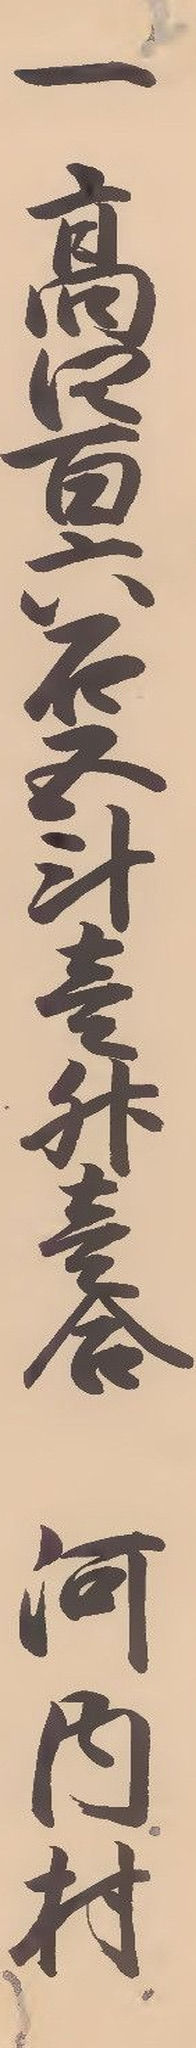一高四百六石五斗壱升壱合河内村
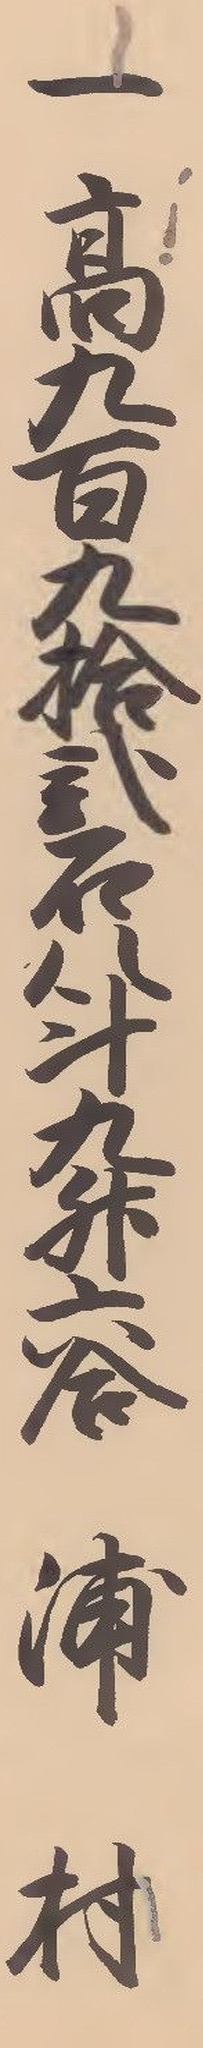一高九百九拾弐石八斗九升六合浦村
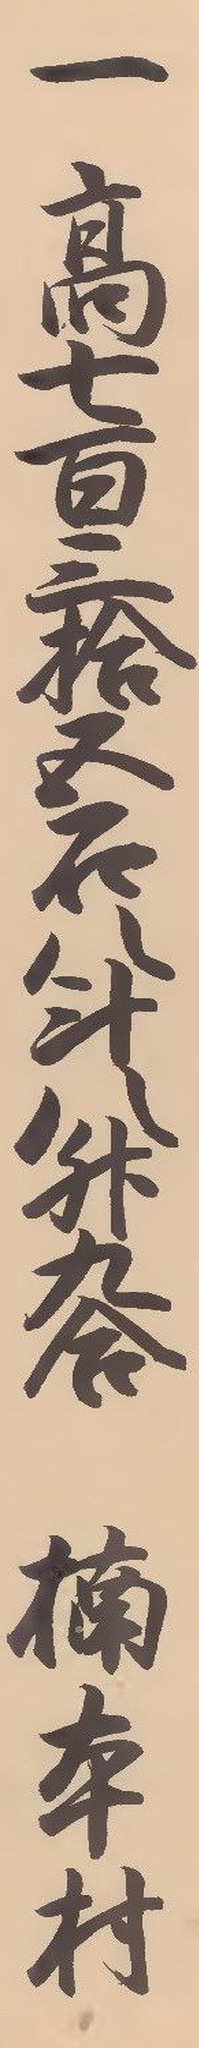一高七百三拾五石八斗八升九合楠本村
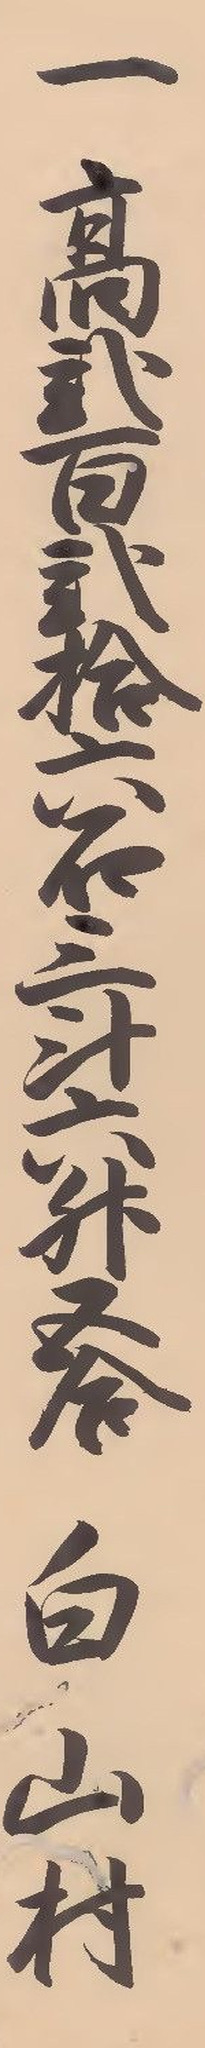一高弐百弐拾六石三斗六升五合白山村
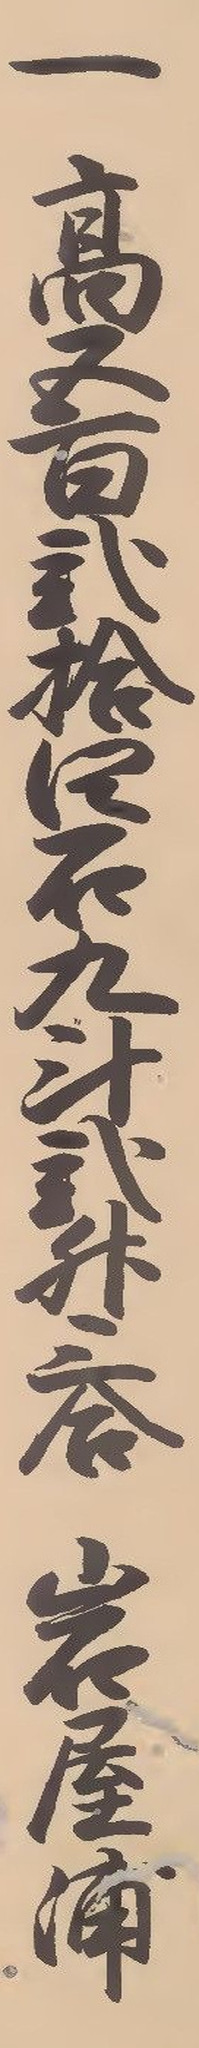一高五百弐拾四石九斗弐升三合岩屋浦
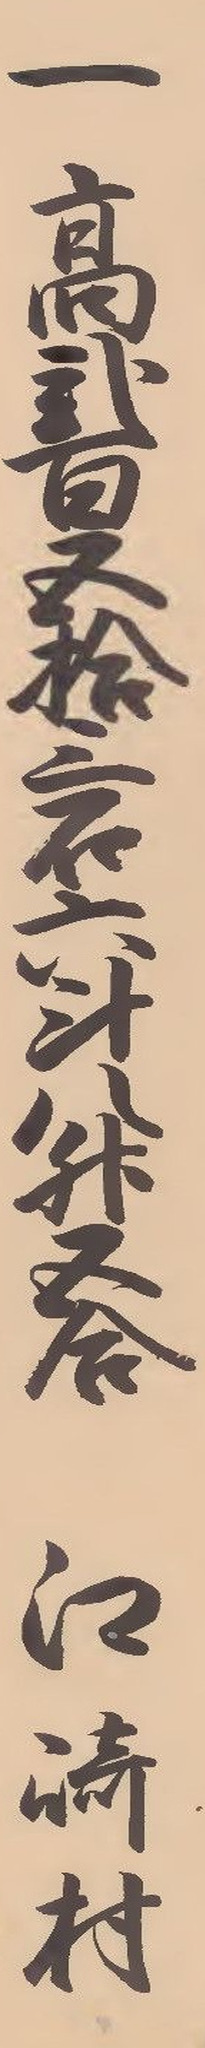一高弐百五拾三石六斗八升五合江崎村
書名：淡路国郷帳
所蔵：国立公文書館 National Archives of Japan
